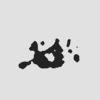𡄹
